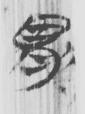{胃刀}
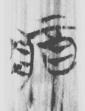𨟻
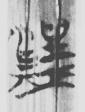{浧皿}
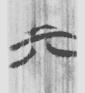亓
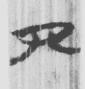四
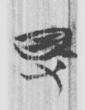𠭁
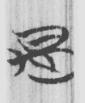是
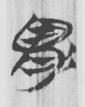{胃刀}
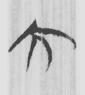大
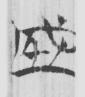城
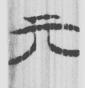亓
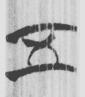五
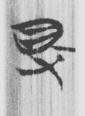𠭁
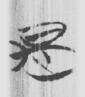是
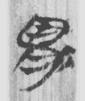{胃刀}
